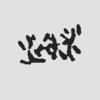沁
